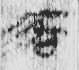客
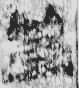監
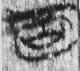固
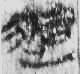○（蹠）
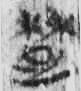楚
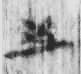之
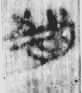歲（歲）
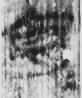亯
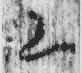乙
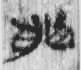卯
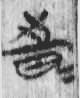之日
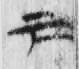下
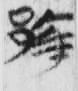○（蔡）
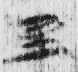里
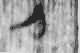人
